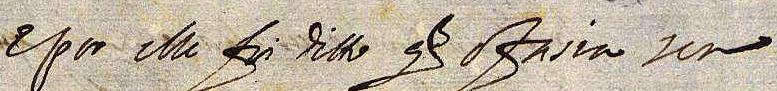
E por elle foi ditto q̄ o fasia seu
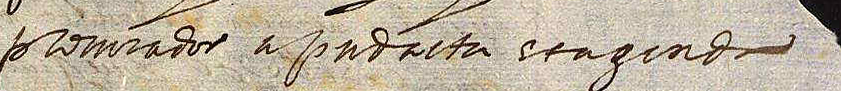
procurador apud acta Et agenda
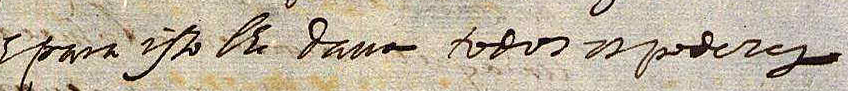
E para isto lhe daua todos os poderes
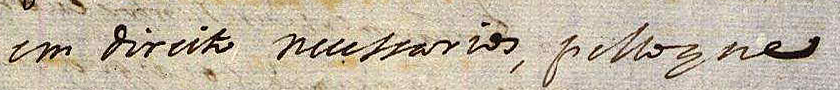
em direito necessarios, pello que
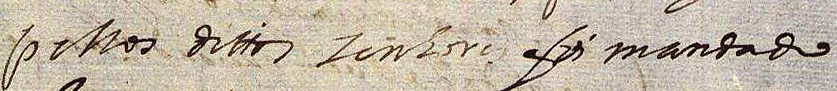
pellos dittos senhores foi mandado
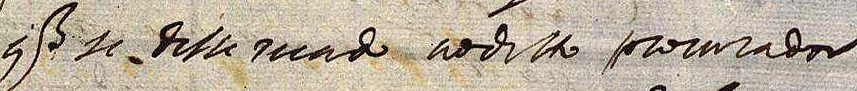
q̄ se desse recado ao ditto procurador
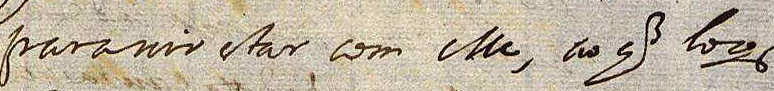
para uir estar com elle, ao q̄ logo
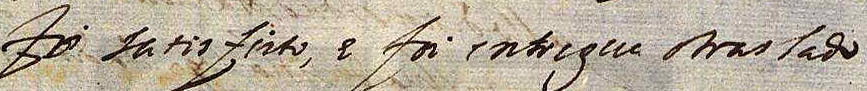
foi satisfeito, E foi entregue o traslado
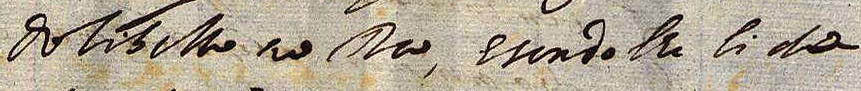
do libello ao Reo, E sendolhe lida
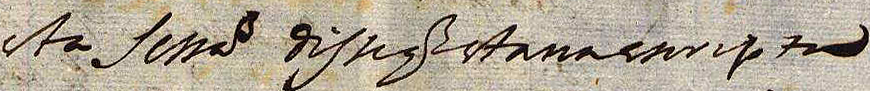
esta Sessaõ disse q̄ estaua Escripta
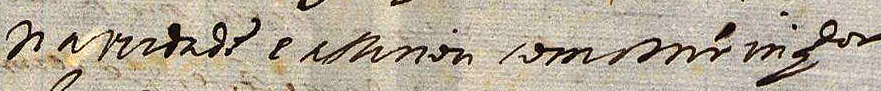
na verdade E assinou com o snr̄ inqdor
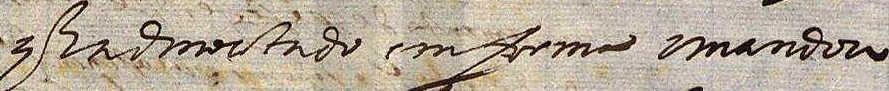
q̄ admoestado em forma o mandou
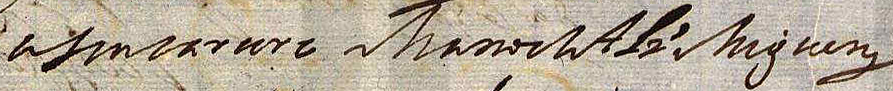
a seu carcere Manoel Alz̄ Miguens
